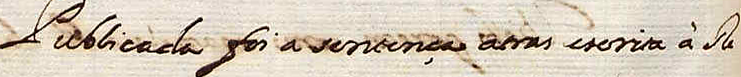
Publicada foi a sentença atras escrita à Re
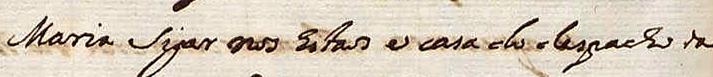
Maria Sigar nos Estaos e casa do despacho da
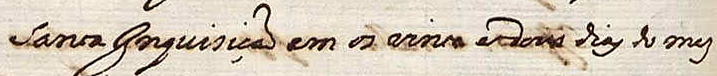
santa Jnquisiçaõ em os vinte e dous dias do mez
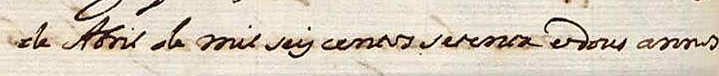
de Abril de mil seiscentos setenta e dous annos
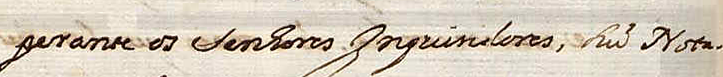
perante os senhores Jnquisidores, hū Nota
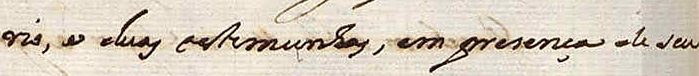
rio, e duas testemunhas, em presença de seu
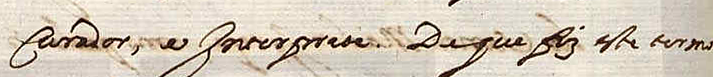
Curador, e Jnterprete. De que fiz este termo
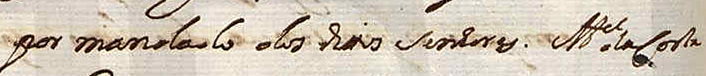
por mandado dos dittos Senhores. M.el da Costa
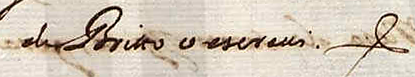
de Brito o escreui. &
